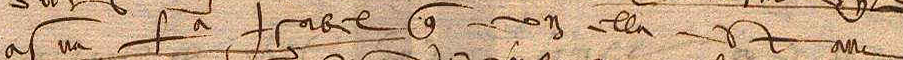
a sua fa Jsabel q̄ com ella estaua
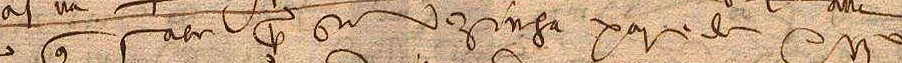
o q̄ sabe p̄o ser vezinha parede e mo
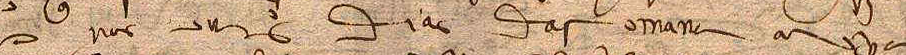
e nos outos dias da somana a vya
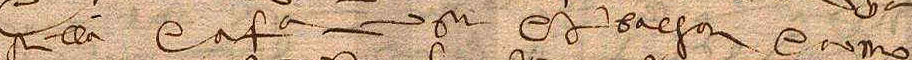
A ella e a fa coser e tibalhar e como
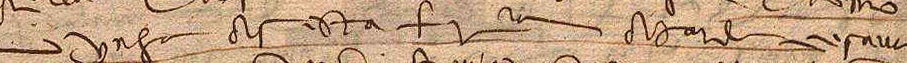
vynha A sesta frra A tarde çesaua
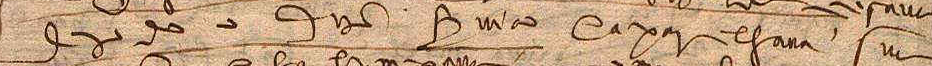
de todo o dito ꞩuiço e aparelhaua sua
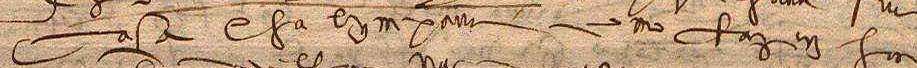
Casa e ha lympaua como fazem hos
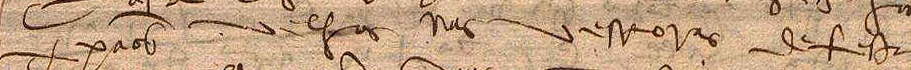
Xpãos velhos nas vesporas de festa
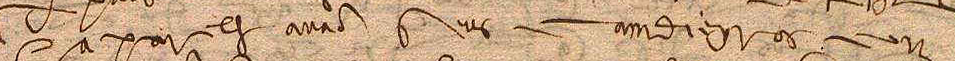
e aparelhauaõ seus camdieyros com
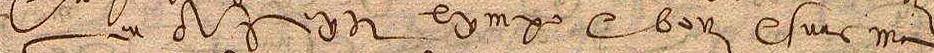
seu Azeyte lympo e bom e suas mā
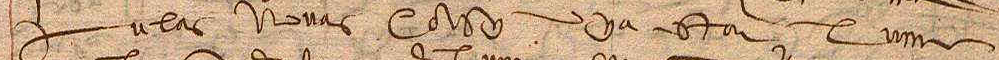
tulas nouas e Asy vya estar lume
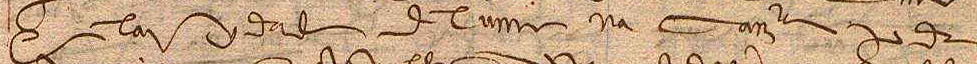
e clarydade de lume na Camra toda
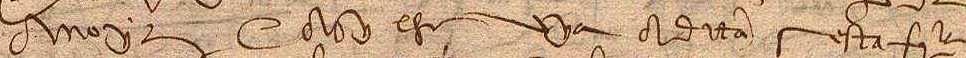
A noyte e Asy lhe vya A dita sesta frra
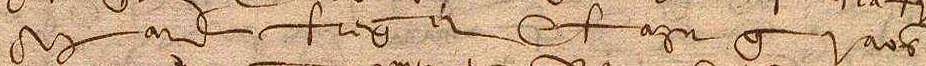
A tarde fregir e fazer graõs
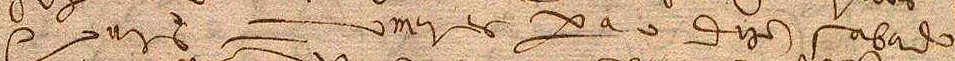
e outos comeres ꝑa o dito sabado
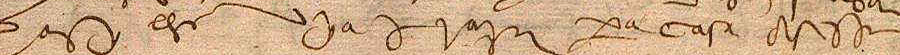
e asy lhe vya trazer ꝑa casa A sesta
